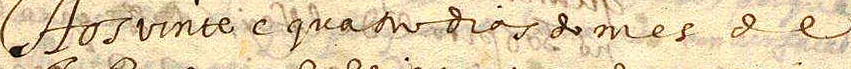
Aos vinte e quatro dias do mes de
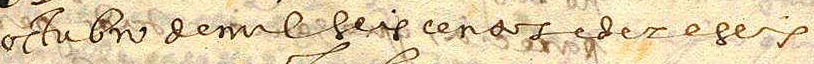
octubro de mil seiscentos e dezeseis
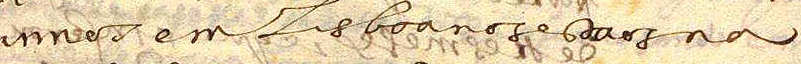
annos em Lisboa nos estaos na
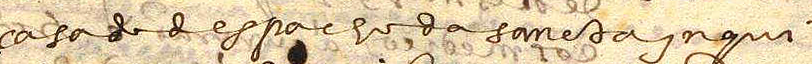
casa do despacho da sancta jnqui
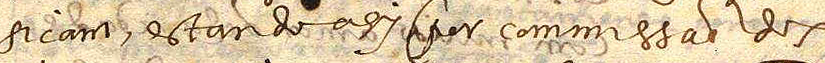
siçam, estando ahy (por commissaõ dos
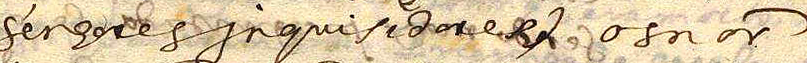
senhores jnquisidores) o snor̄
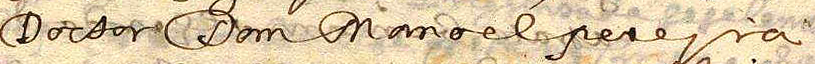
Doctor Dom Manoel perejra
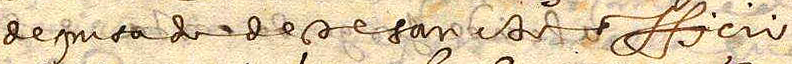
deputado deste sancto offjçio
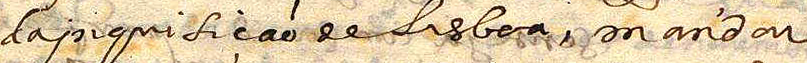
da jnquisiçaõ de Lisboa, mandou
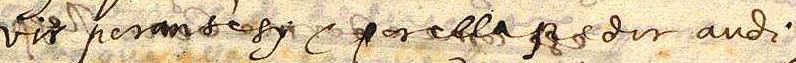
vir perante sy (por ella pedir audi
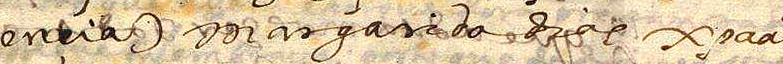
ençia) margarida dias xpaã
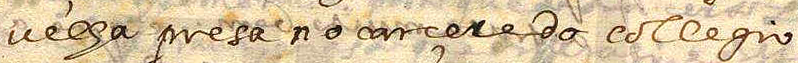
uelha presa no carçere do collegio
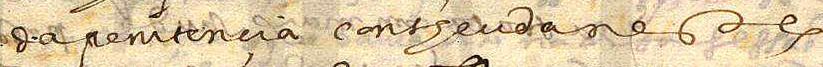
da penitençia contheuda nestes
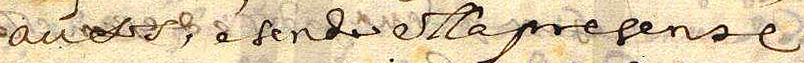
autos, e sendo ella presente
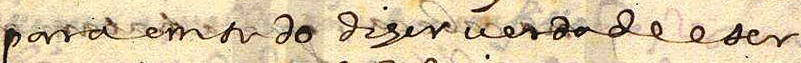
para em tudo dizer uerdade e ter
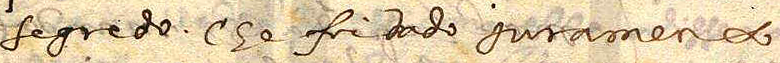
segredo. lhe foi dado juramento
